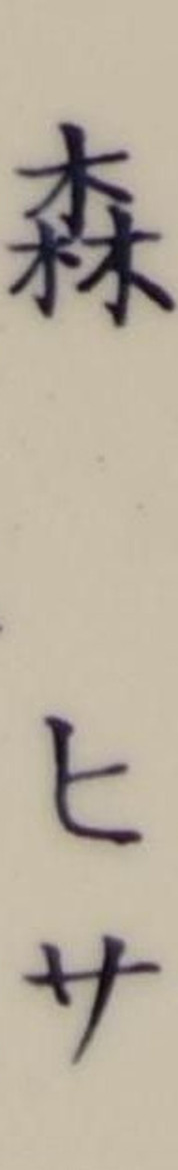森ヒサ
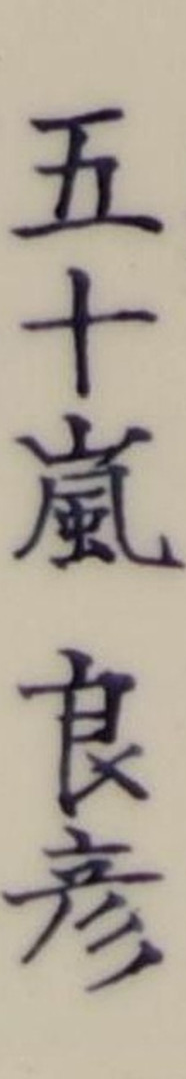五十嵐良彦
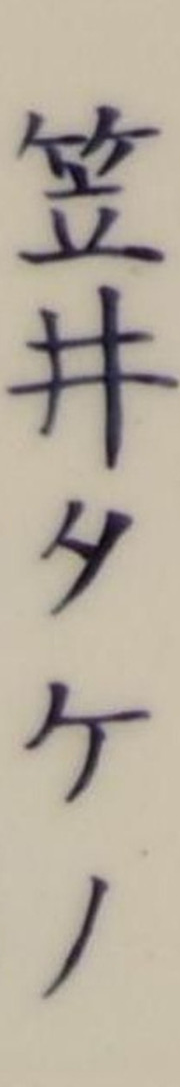笠井タケノ
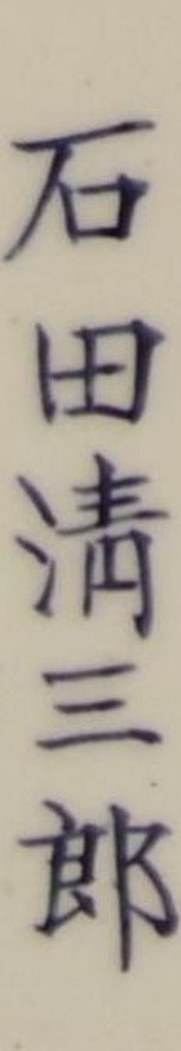石田清三郎

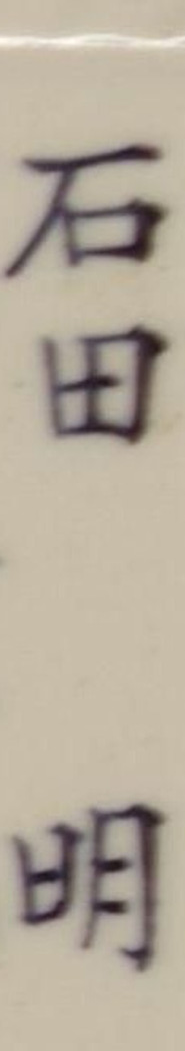石田明
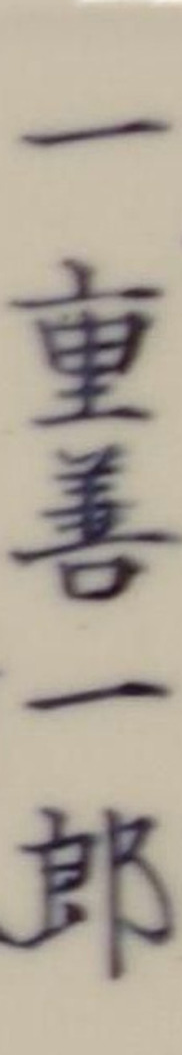一重善一郎
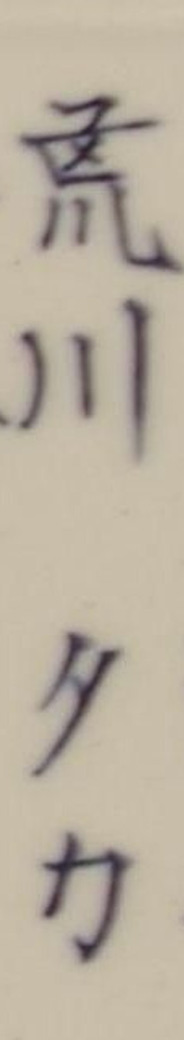荒川タカ
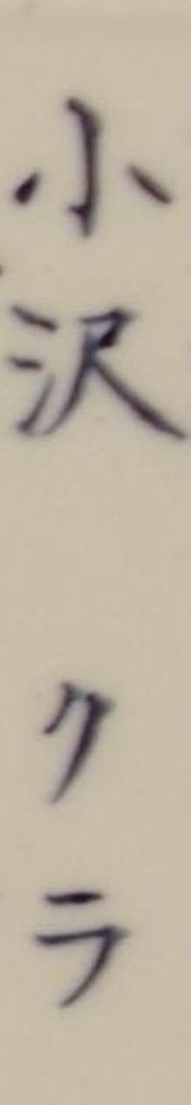小沢クラ
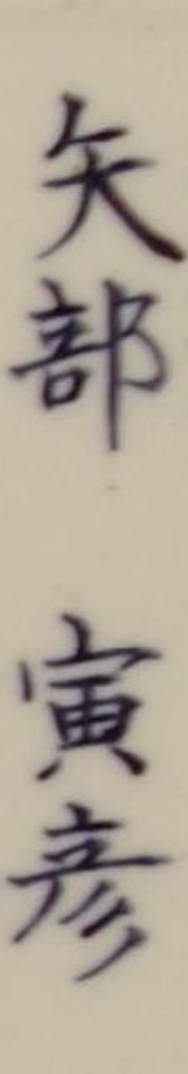矢部寅彦
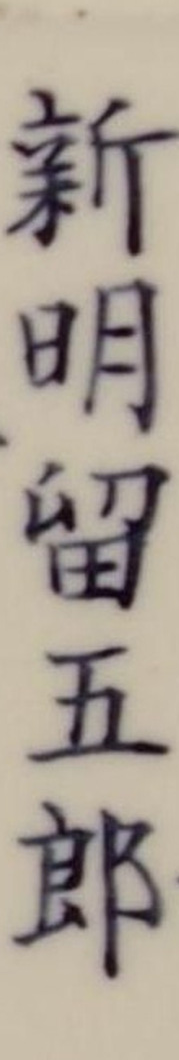新明留五郎
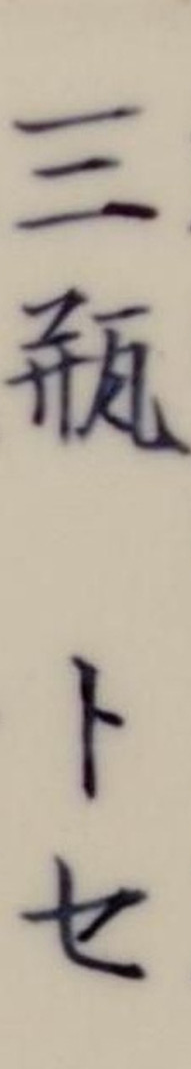三瓶トセ
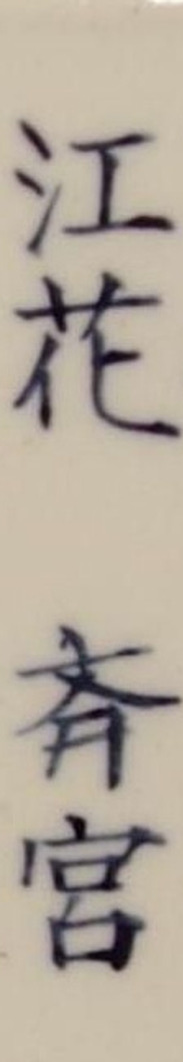江花斎宮
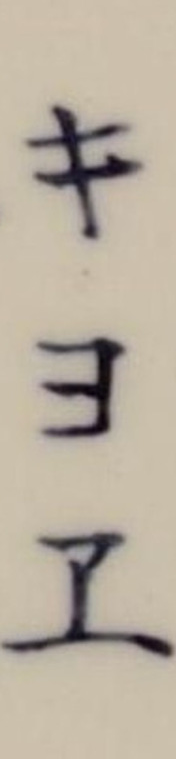キヨヱ
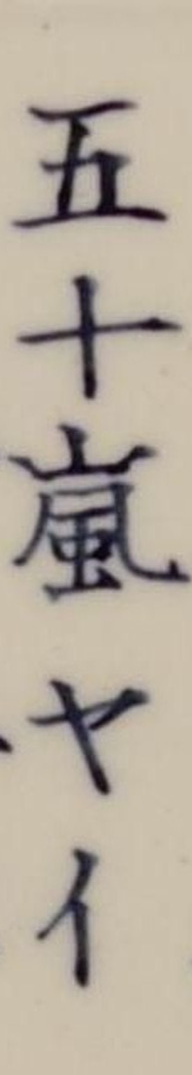五十嵐ヤイ
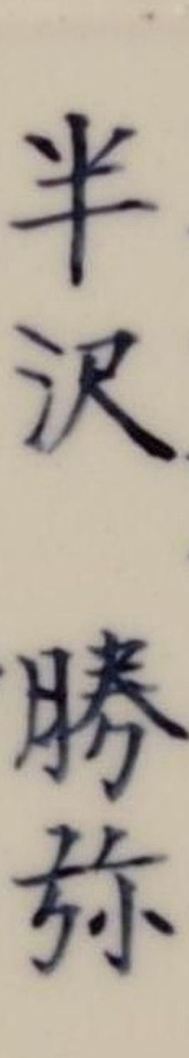半沢勝弥
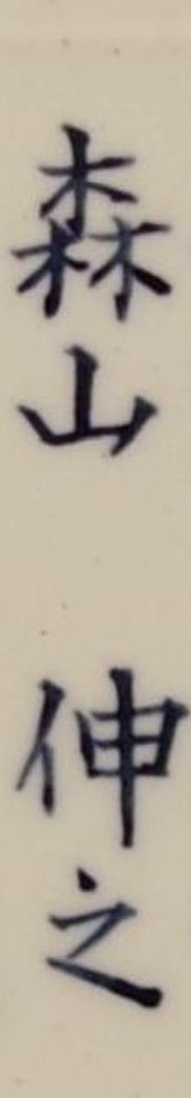森山伸之
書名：E~L
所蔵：高野山金剛峯寺
